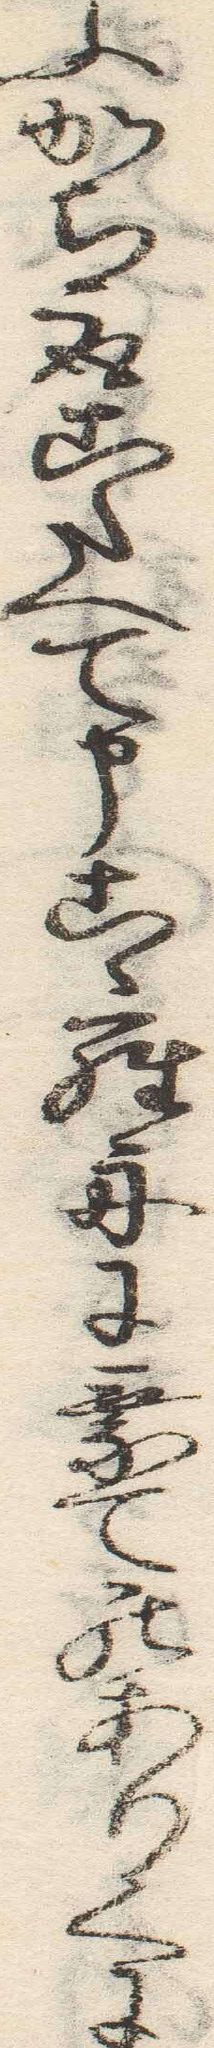ふかち取こたへて申こゝら舟に乗て罷ありくに
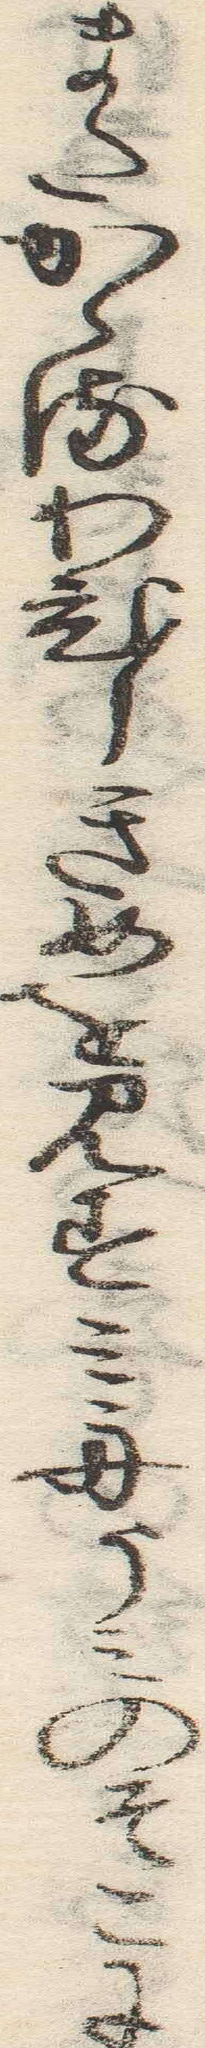またかゝるわひしきめを見すみ舟うみのそこに
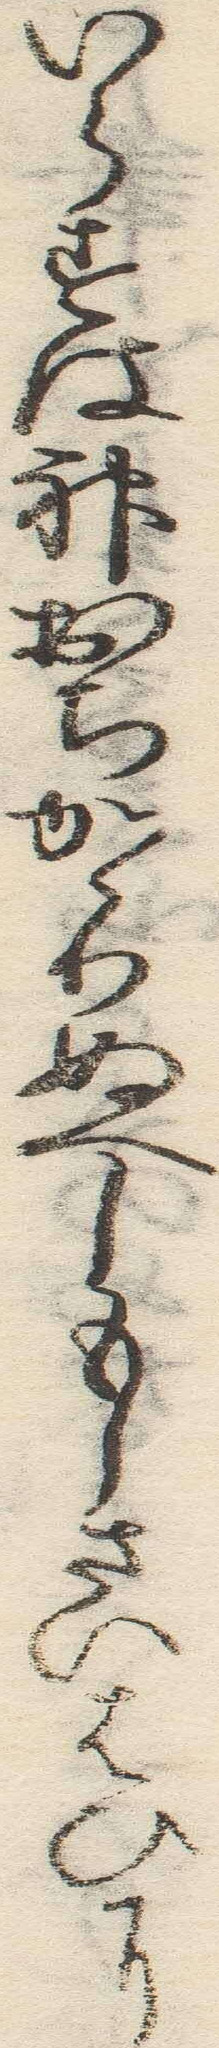いらすは神おちかゝりぬへしもしさいはひに
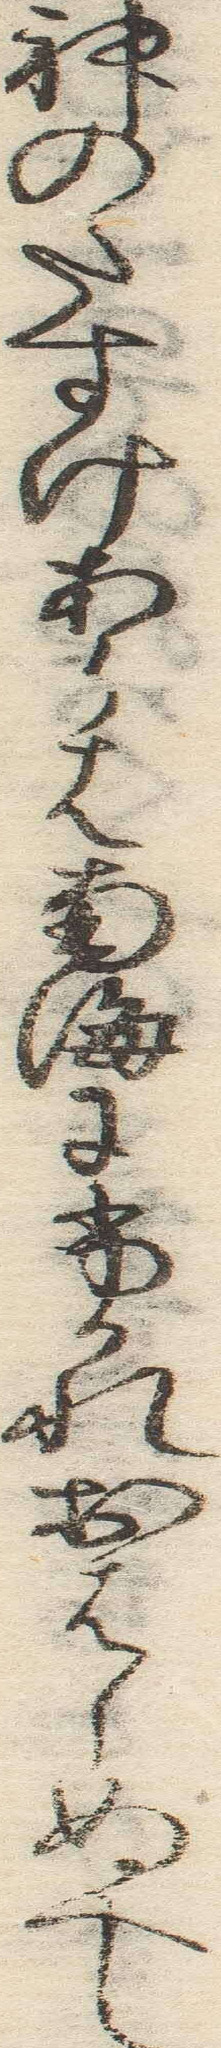神のたすけあらは南海にふかれおはしぬへし
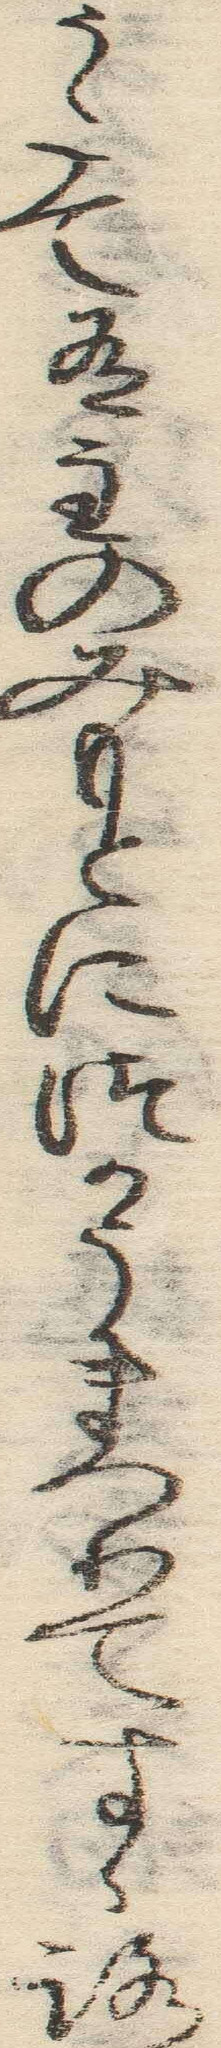うたて有主のみもとにつかうまつりてすゝろ

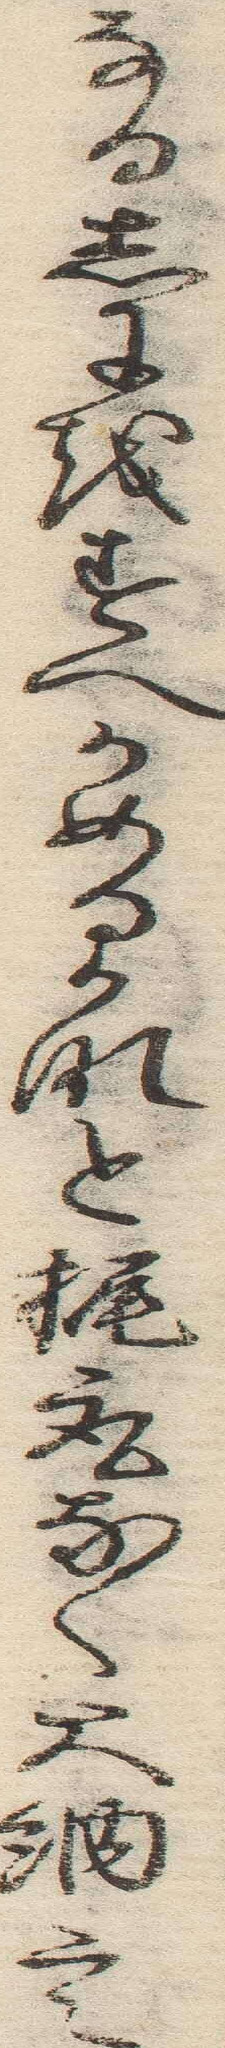なるしにをすへかめるかな梶取なく大納言
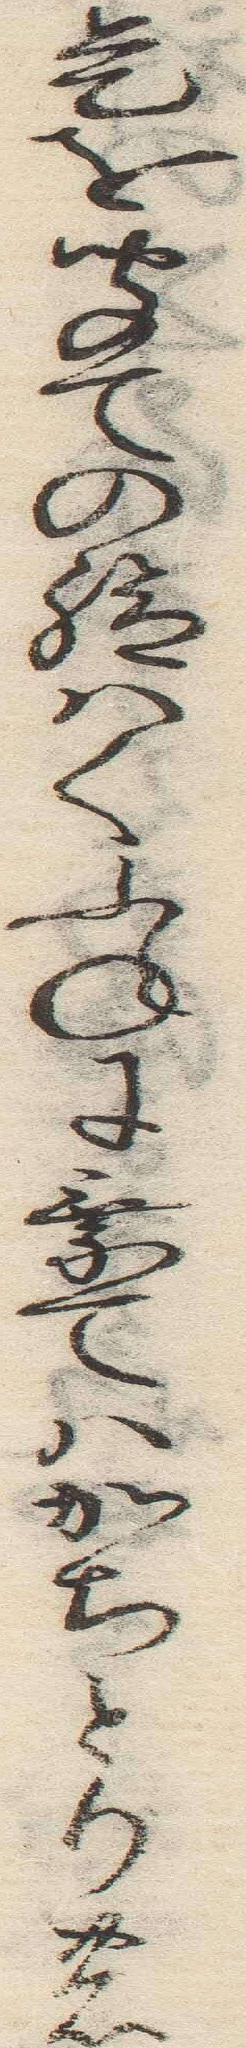是を聞ての給はくふねに乗てはかちとりの
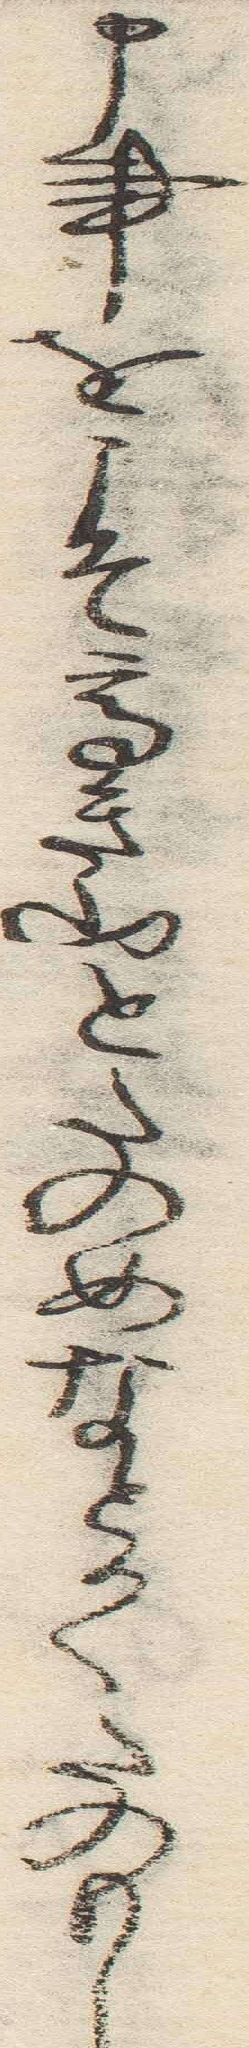申事をこそ高き山とたのめなとかくたのもし
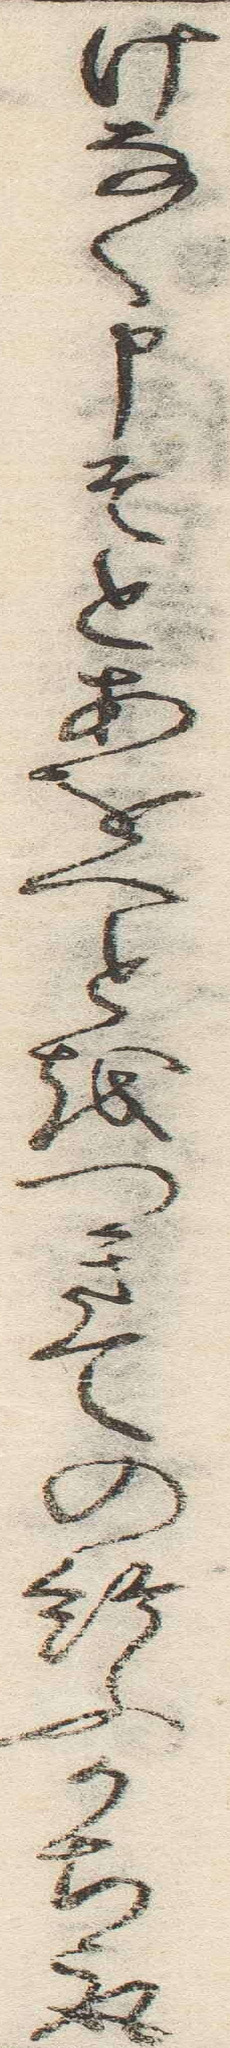けなく申そとあをへとをつきての給ふかち取
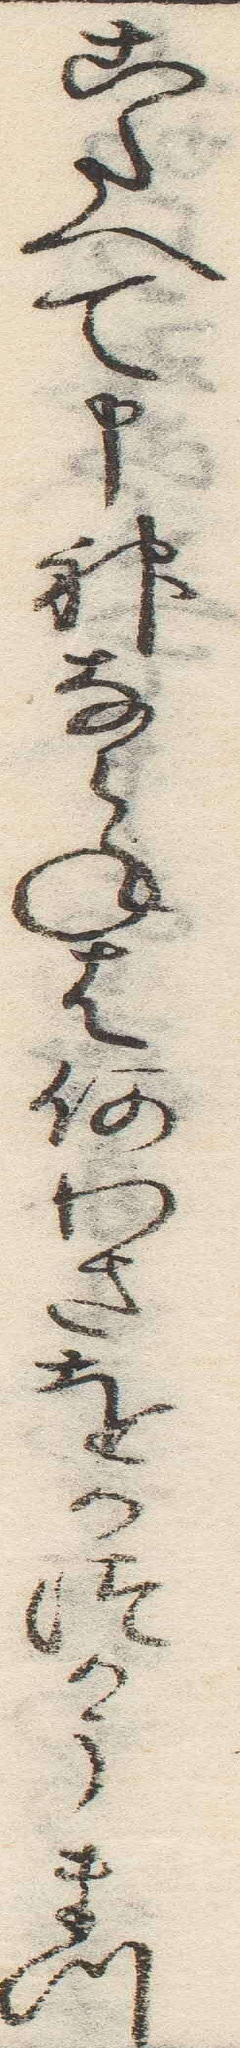こたへて申神ならねは何わさをかつかうまつ
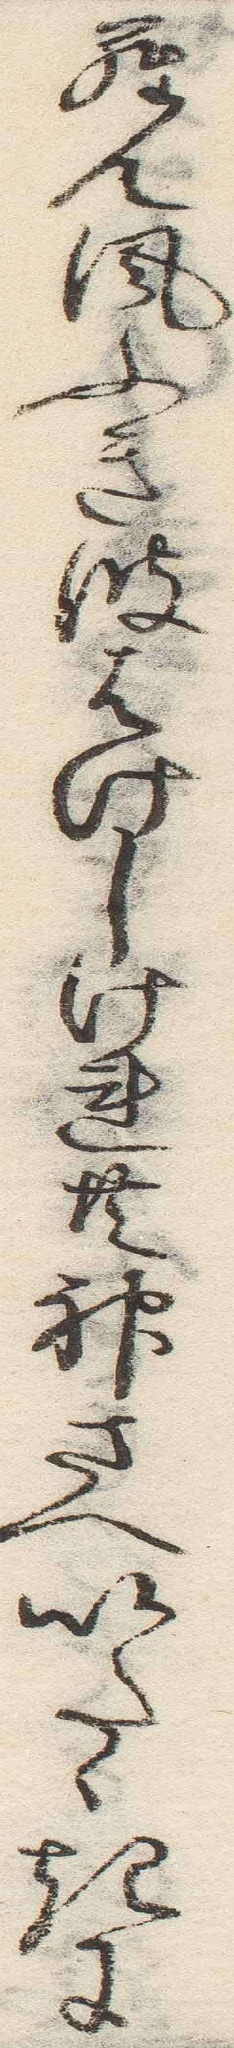らん風ふき波はけしけれ共神さへいたゝきに
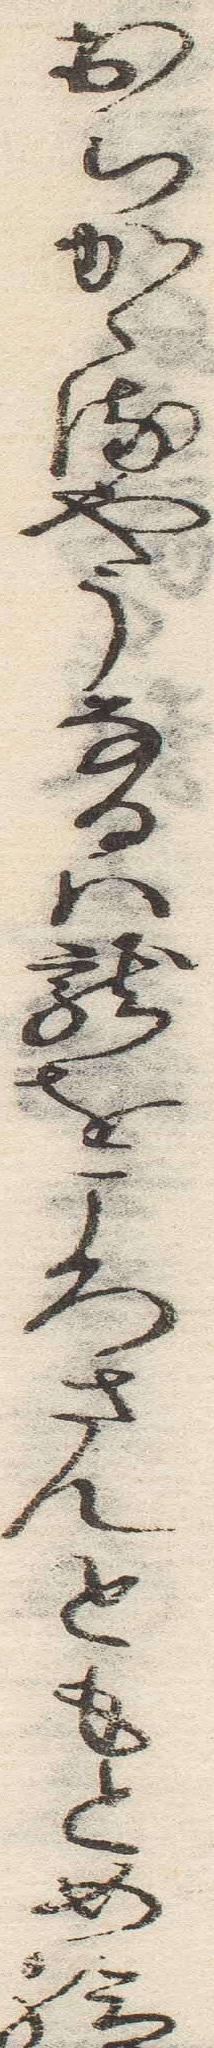おちかゝるやうなるは龍をころさんともとめ給
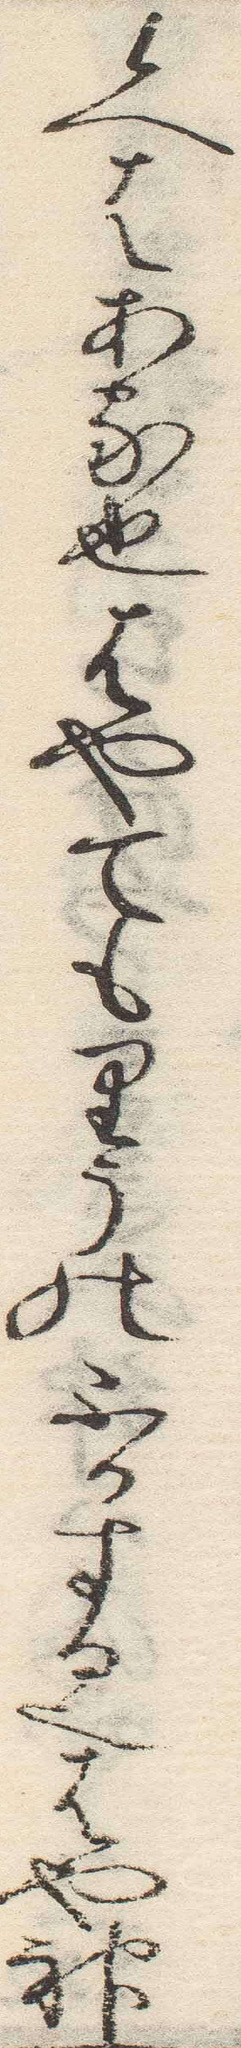えへはある也はやてもりうのふかする也はや神
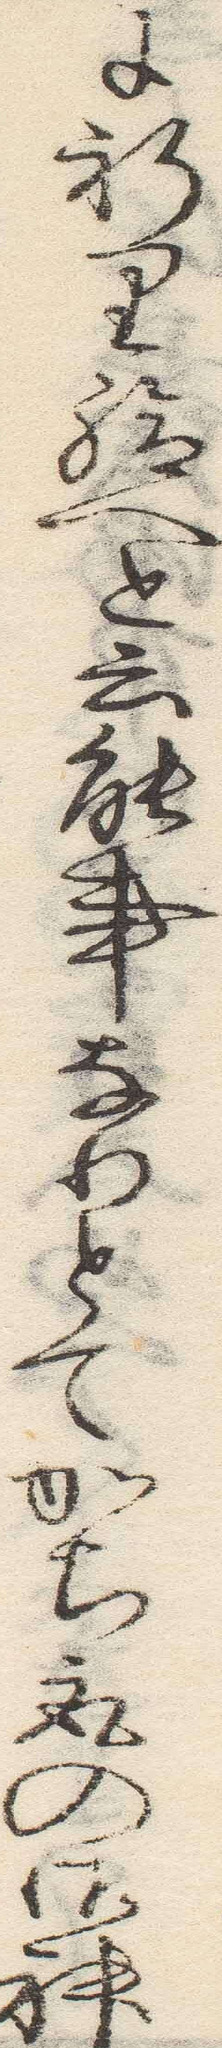に祈り給へと云能事なりとてかち取の御神
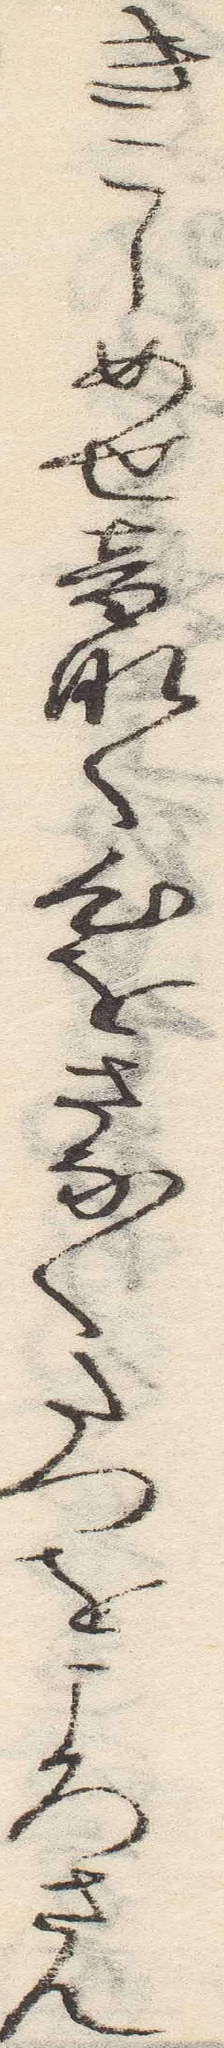きこしめせ音なく心をさなくたつをころさん
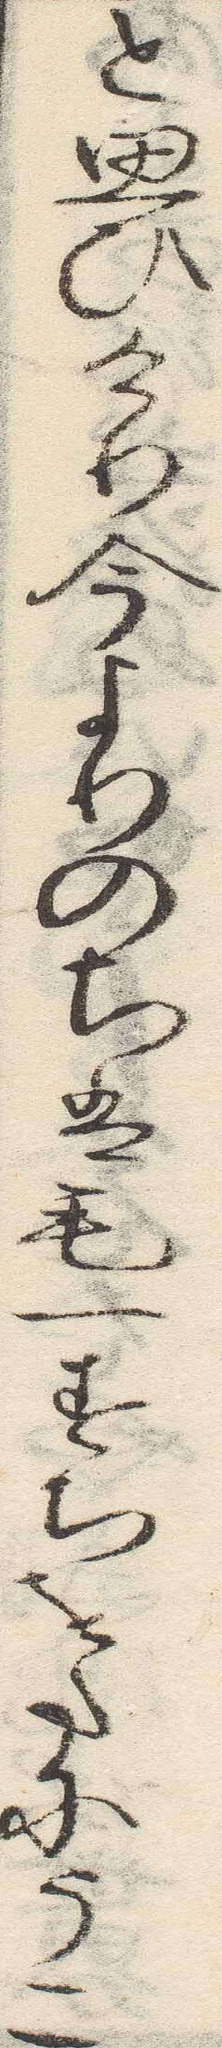と思ひけり今よりのちは毛一すちをたにうこ
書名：竹取物語
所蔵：東京学芸大学附属図書館 国文学研究資料館
